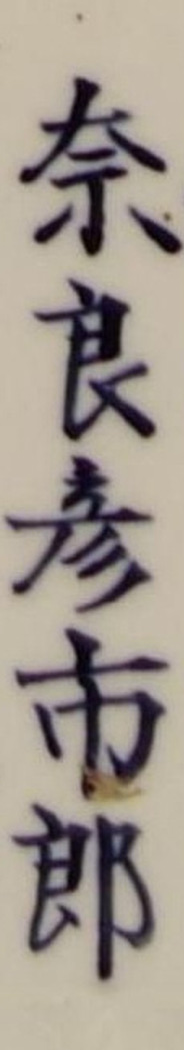奈良彦市郎
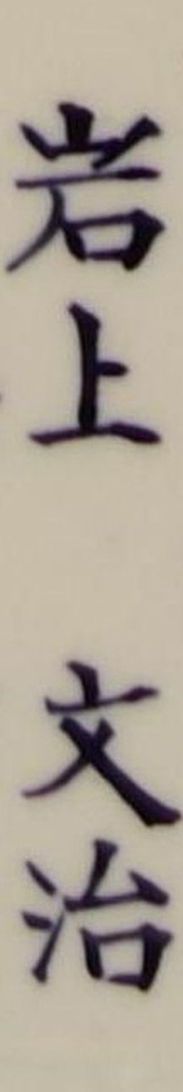岩上文治
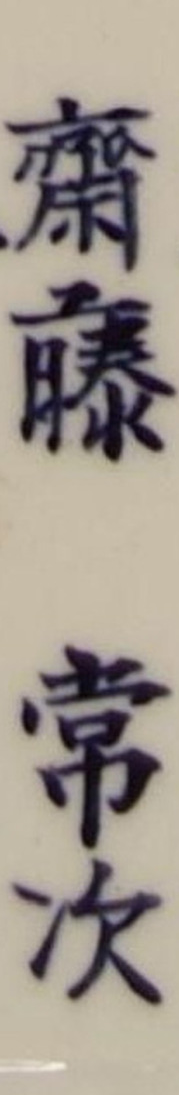齋藤常次
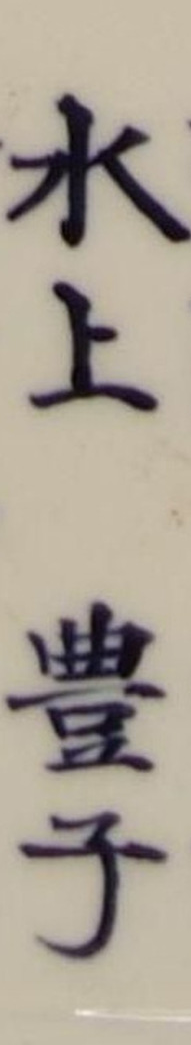水上豊子
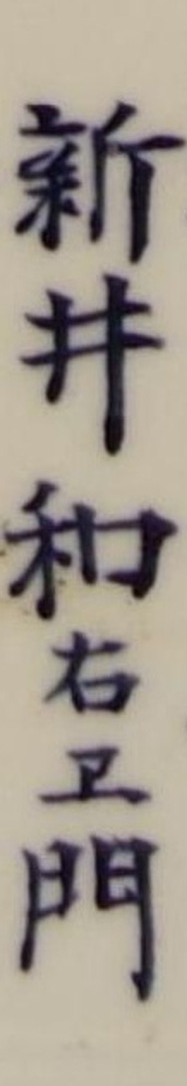新井和右ヱ門
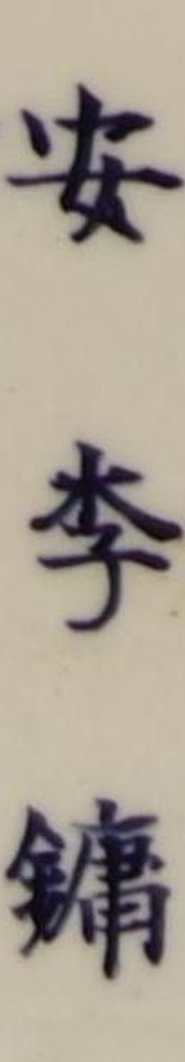安李鏞
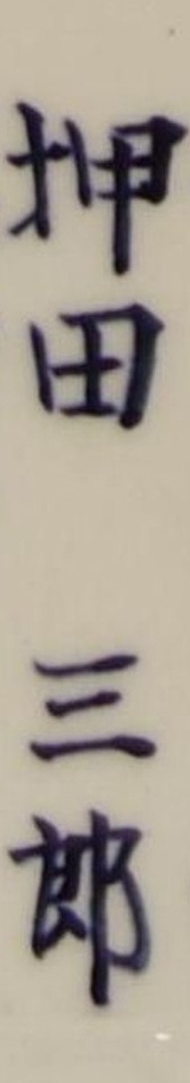押田三郎
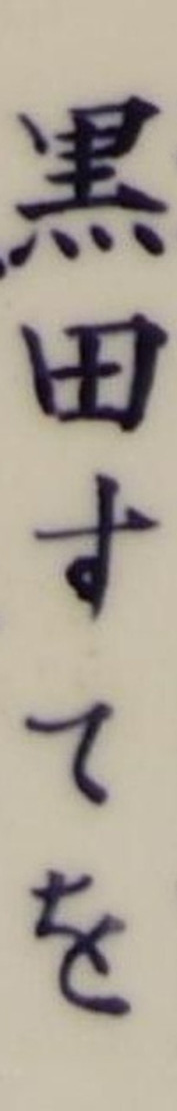黒田すてを
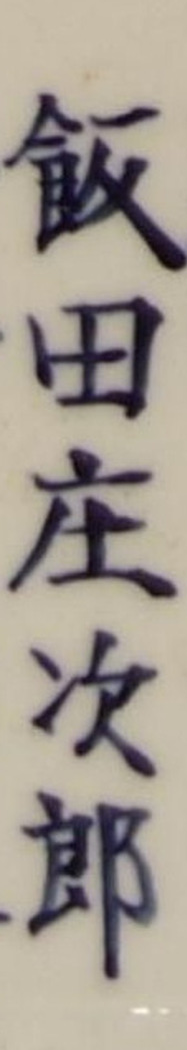飯田庄次郎
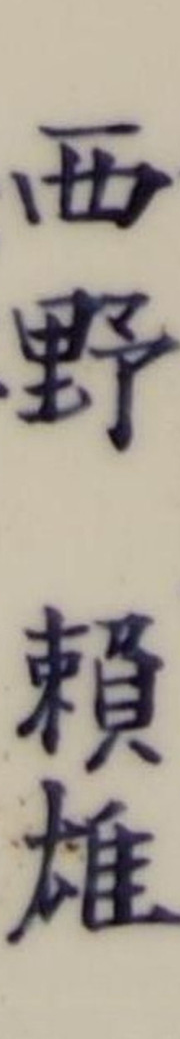西野頼雄
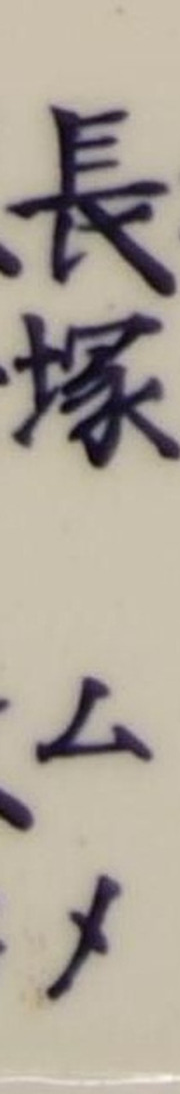長塚ムメ

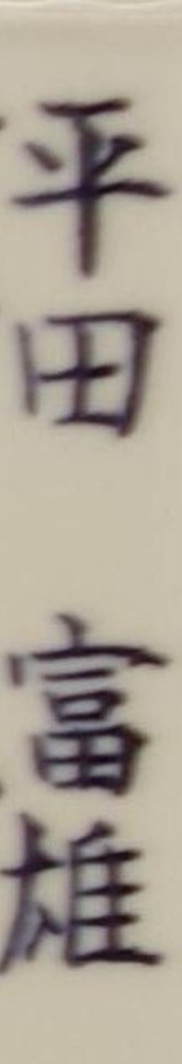平田富雄
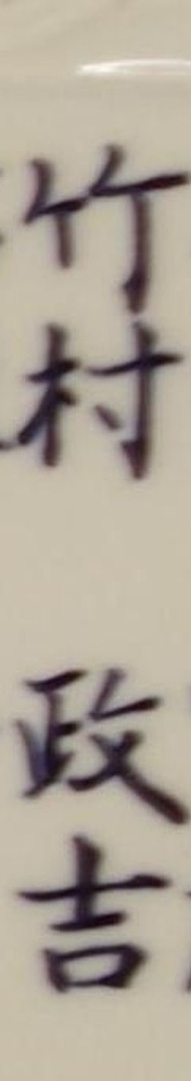竹村政吉
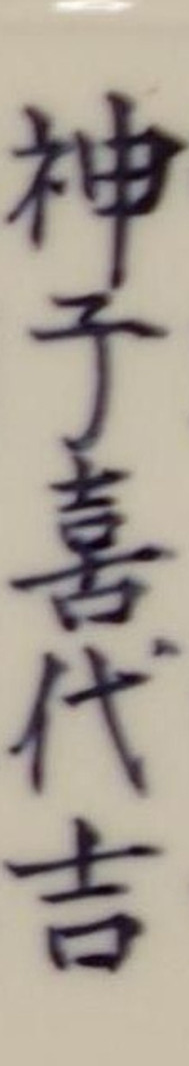神子喜代吉
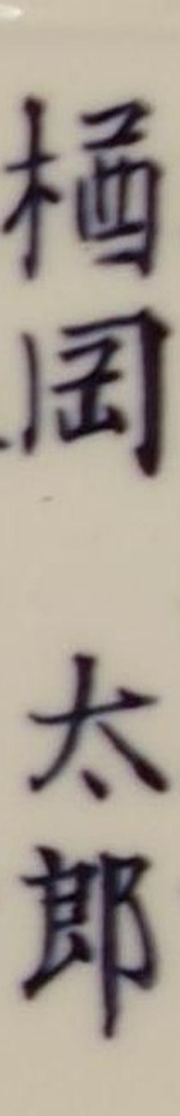楢岡太郎
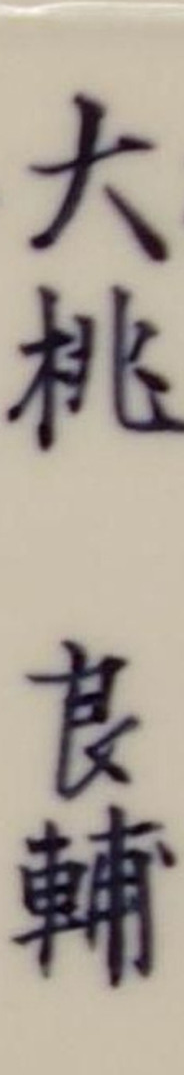大桃良輔
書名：E~L
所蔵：高野山金剛峯寺
